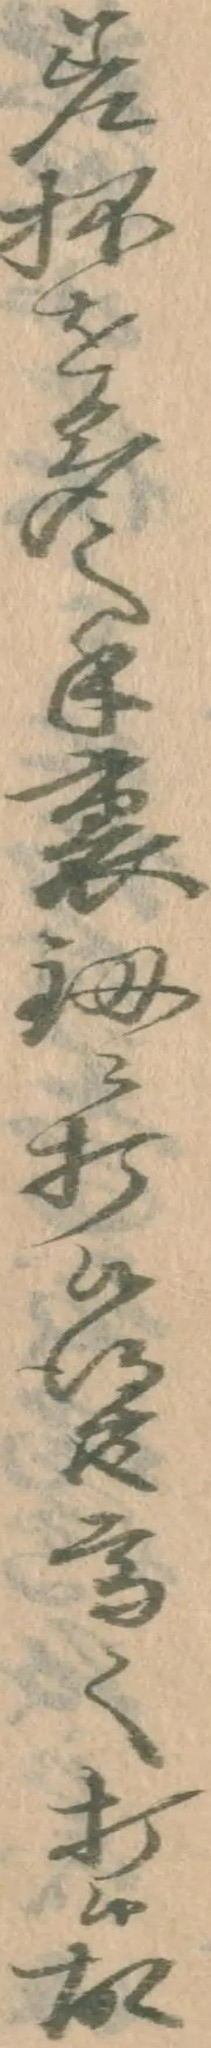差抔を多く手裏釼に打候得共高く打候故
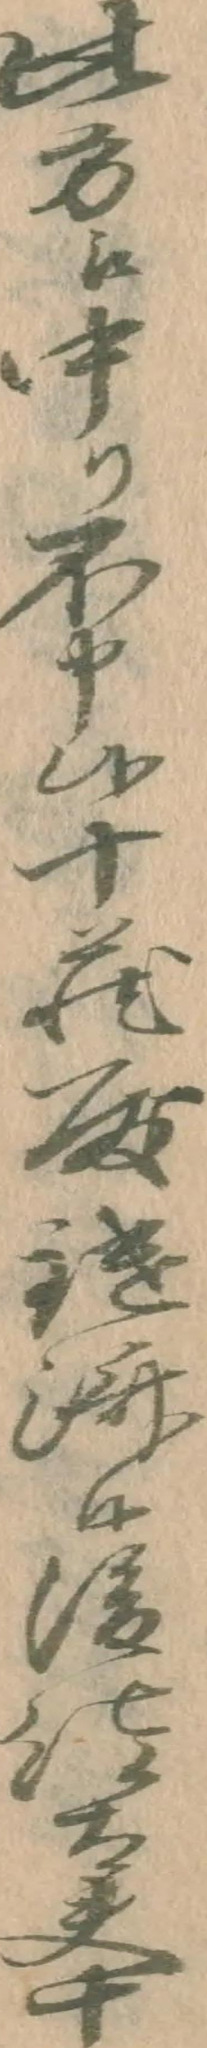此方江中り不申候十蔵殿鑓済候後佐太夫十
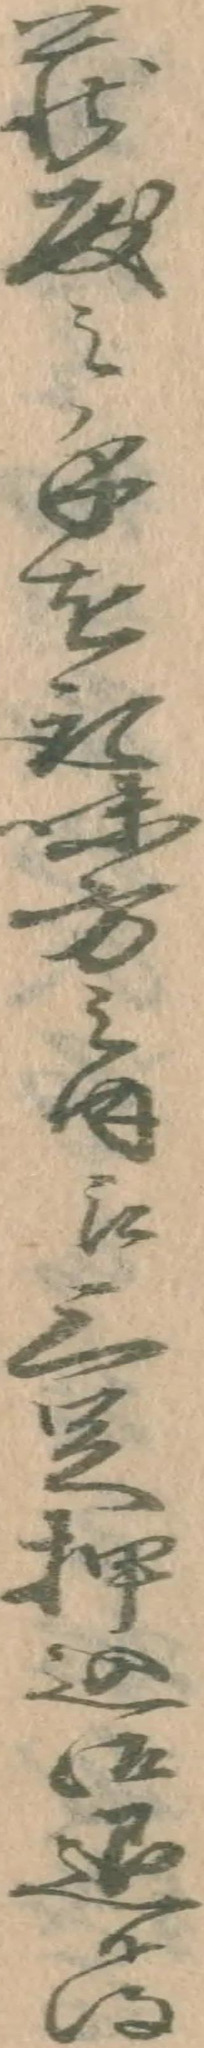蔵殿之手を取味方之内江三足押込御退候得
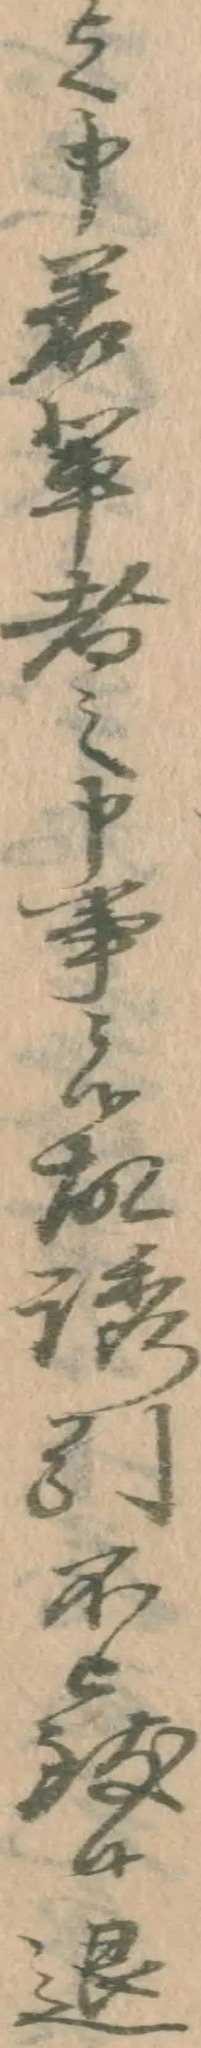与申若軍者之申事に候故誘引不被致候退
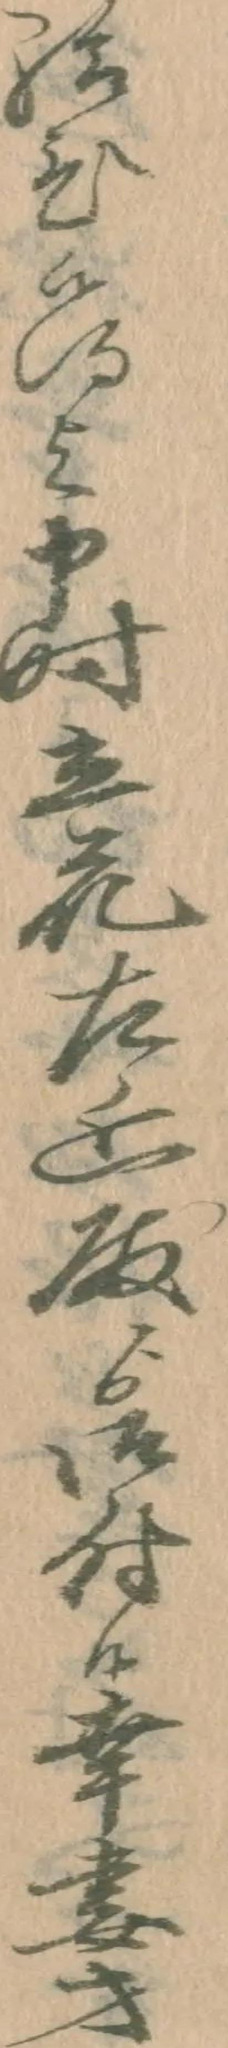給ひ候得与申時立花左近殿ゟ御付候幸妻才
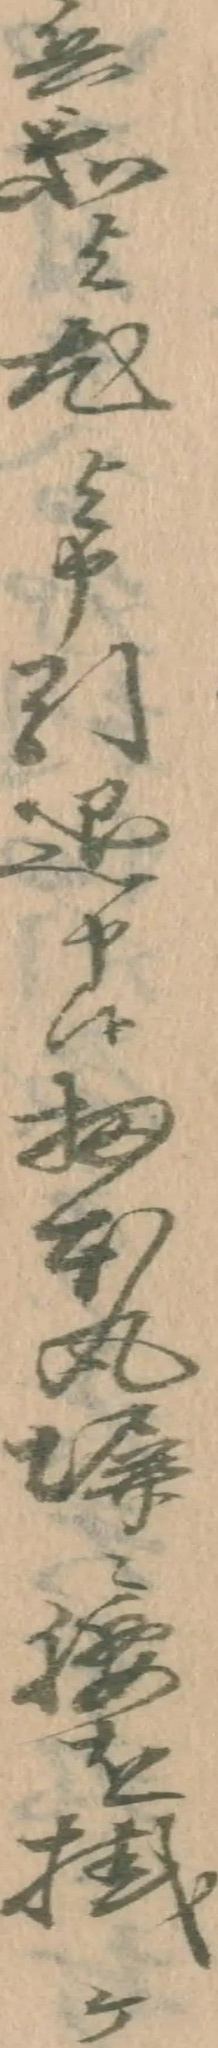兵衛与尤与申引退申候扨本丸塀に腰を掛け
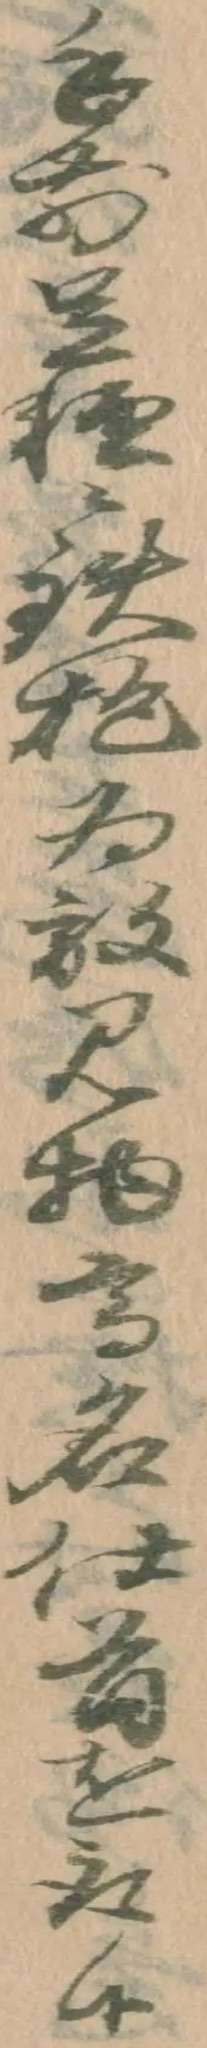手前足軽に鉄炮為放見物高名仕首を取候
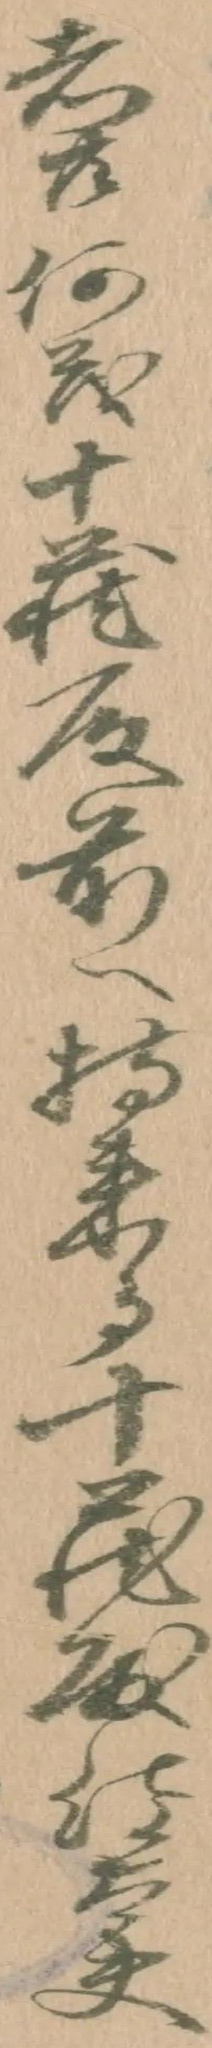者共何茂十蔵殿前へ持参る十蔵殿佐太夫
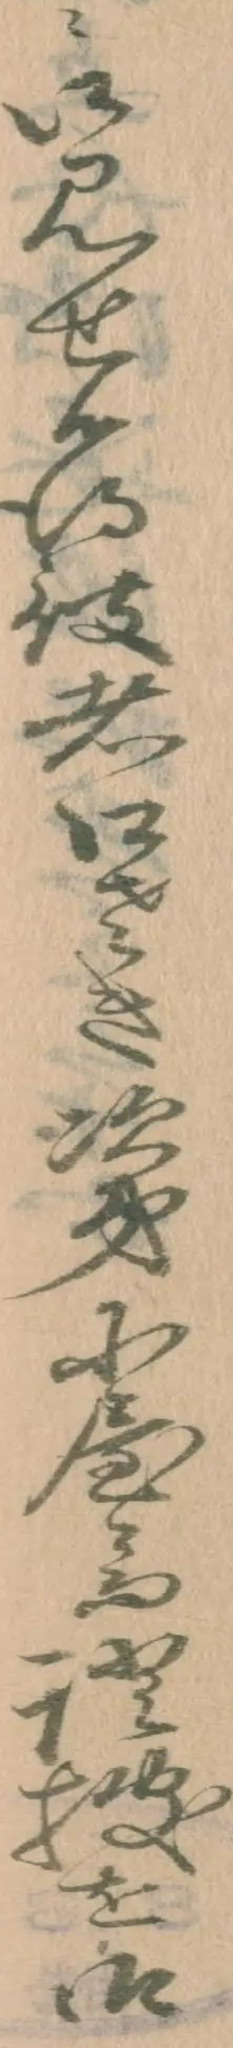に御見せ候得彼者口さき次第小屋に而證拠を御
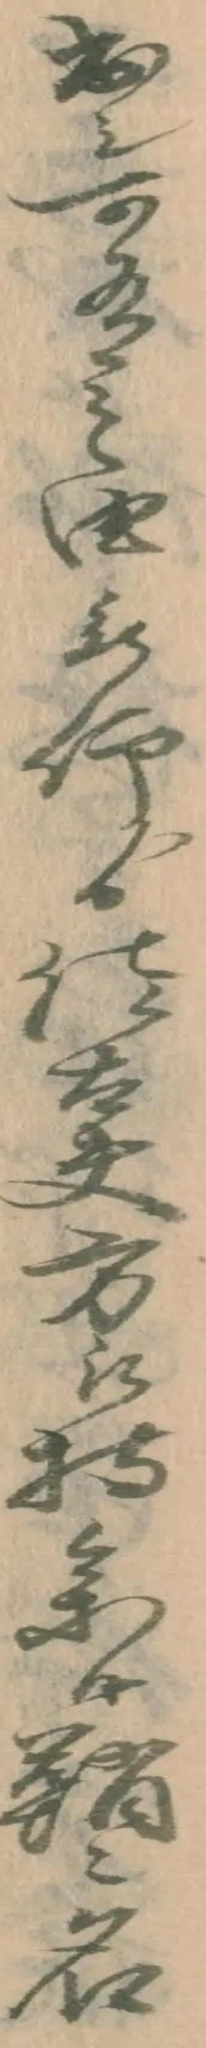出し可有之由被仰ゟ佐太夫方江持参候鞘に名
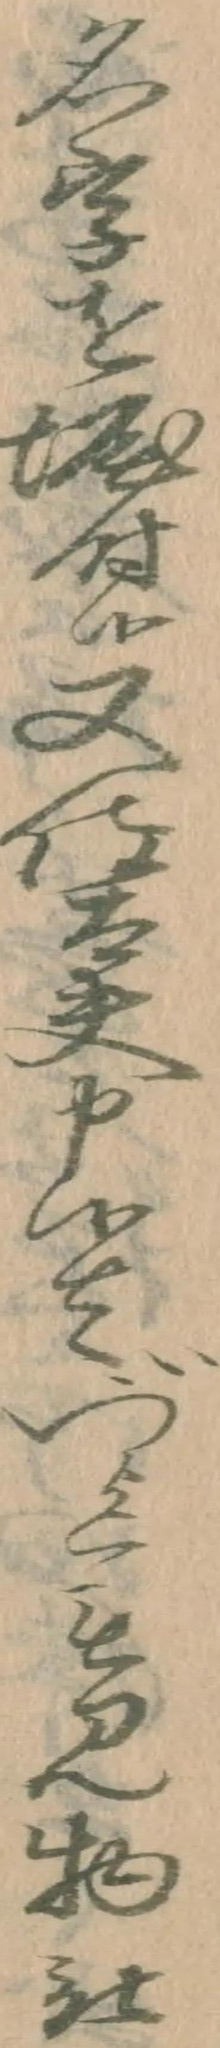名字を堀付候又佐太夫申候者づ迄も見物被
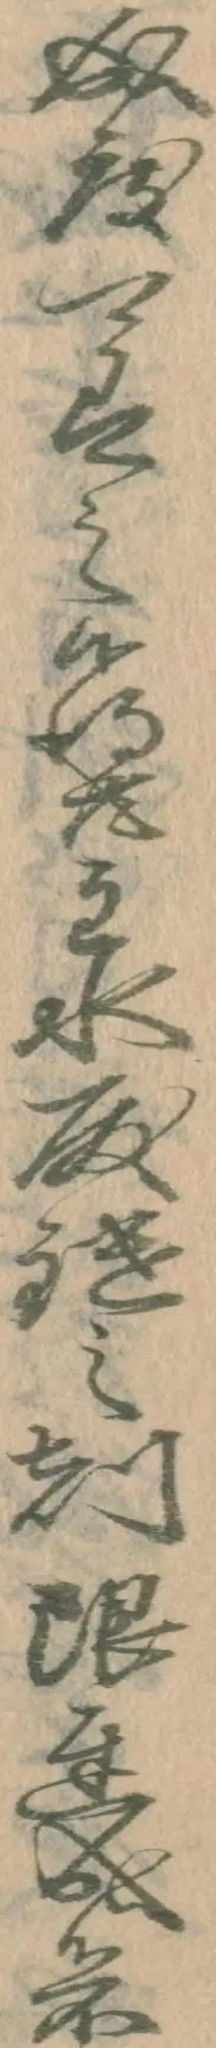成度可尽之候得共主水殿鑓之刻限遅成候不
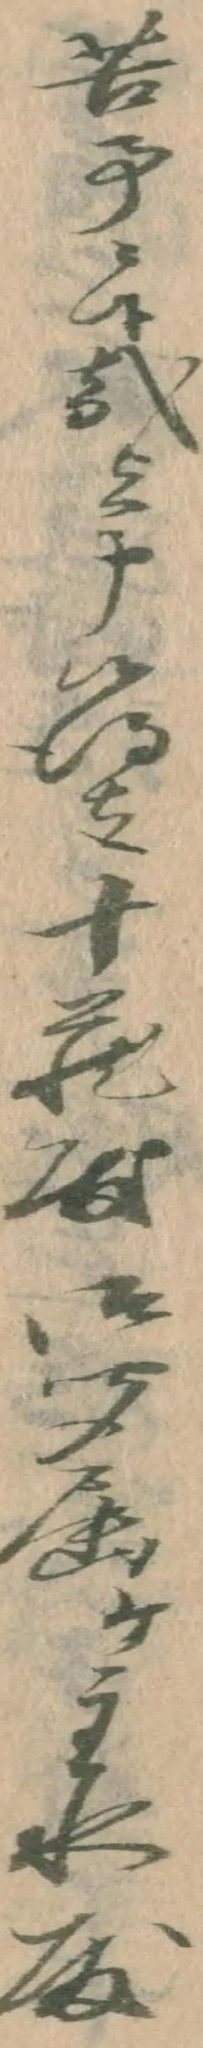苦事に候哉与申候得者十蔵殿御聞届け主水殿
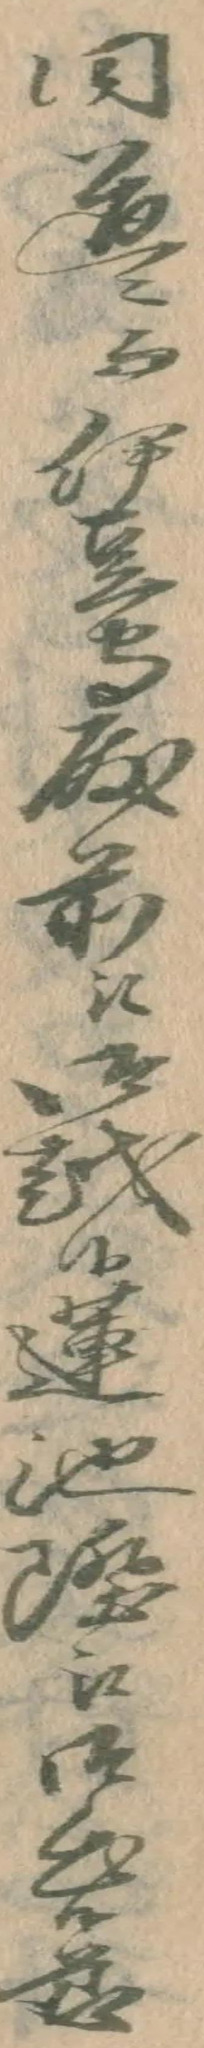同道に而伊豆守殿前江御越候蓮池際江御出候節
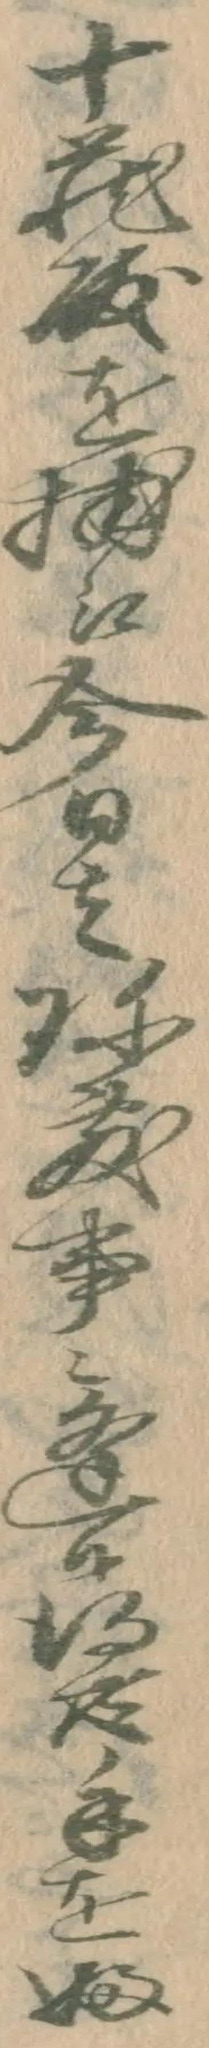十蔵殿を捕江今日者珍敷事に逢候得共手を婦
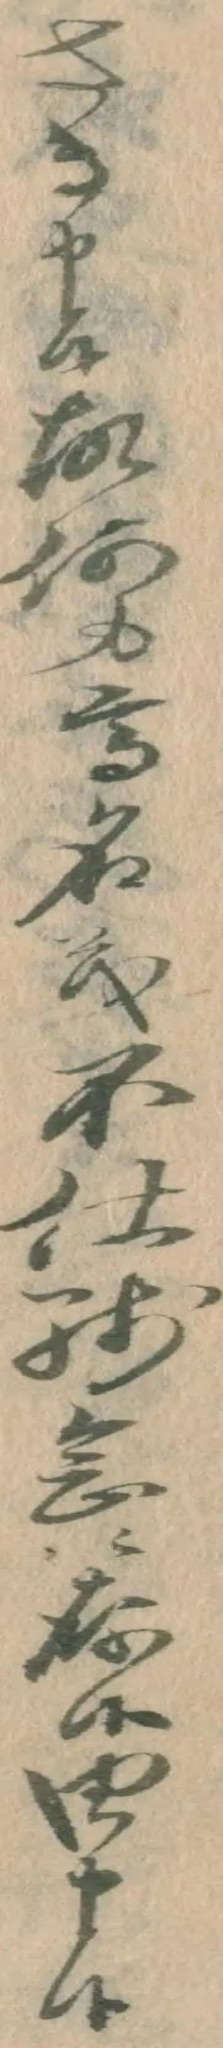さき申候故何も高名茂不仕残念に存候由申候
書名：切支丹御退治記 49巻. [8]
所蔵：国立国会図書館 National Diet Library, JAPAN
